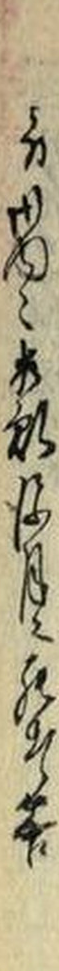二付御内々相願後月々罷出候筈
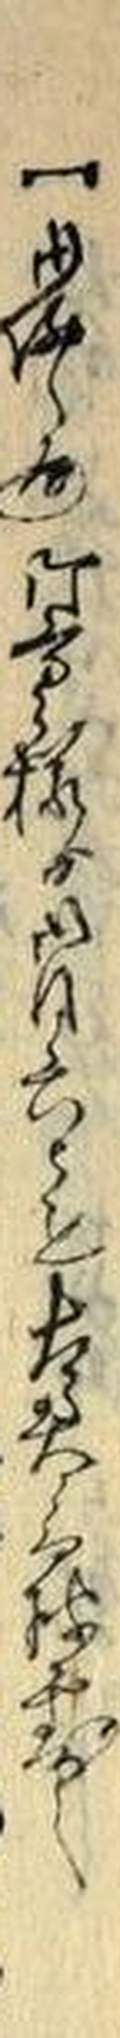一御例之通御方々様ゟ御目六被進大奥二而披露之
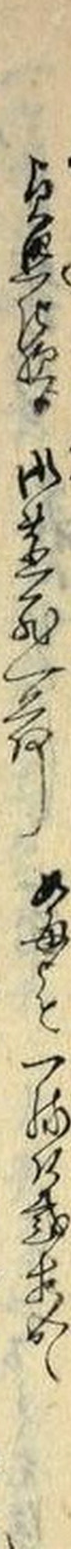貞照院様ゟ御蒸籠一荷如毎被進一統頂戴相成候
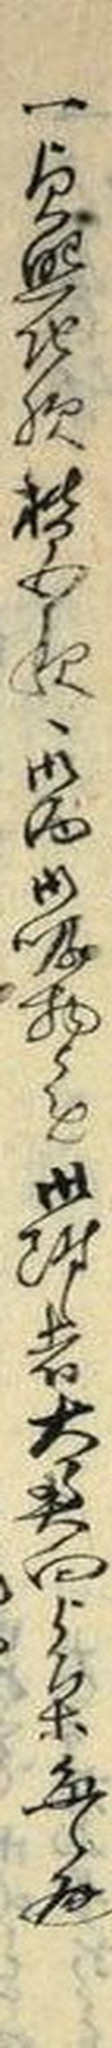一貞照院様揩五郎様へ御酒御吸物被進御附之者大奥向被下等毎之通
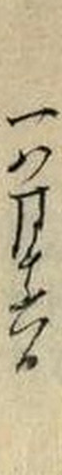一八月十二日
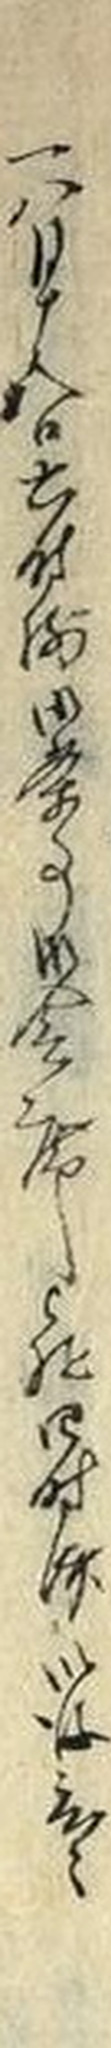一八月十八日六時揃御茶事御会席被遊四時済以後度々
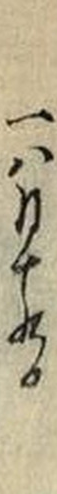一八月十九日
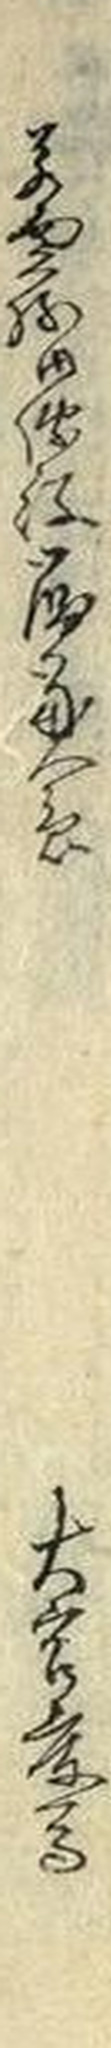若殿様御傅役御側御用人兼大宮藤馬
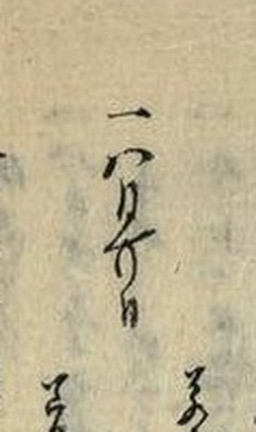一八月廿日
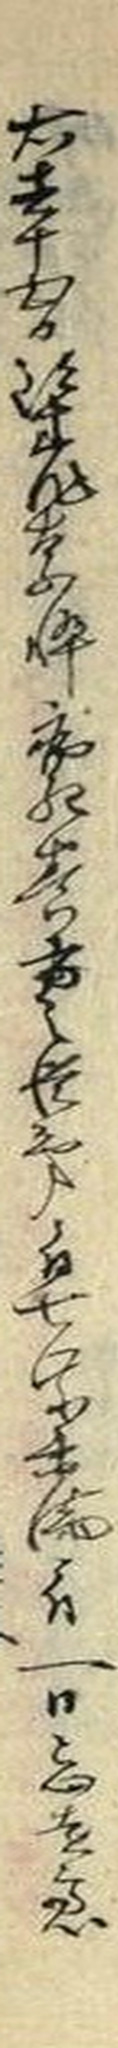右去十五日鈴木作太夫忰病死養方之従弟ニ付七歳未満ニ付一日忌遠慮
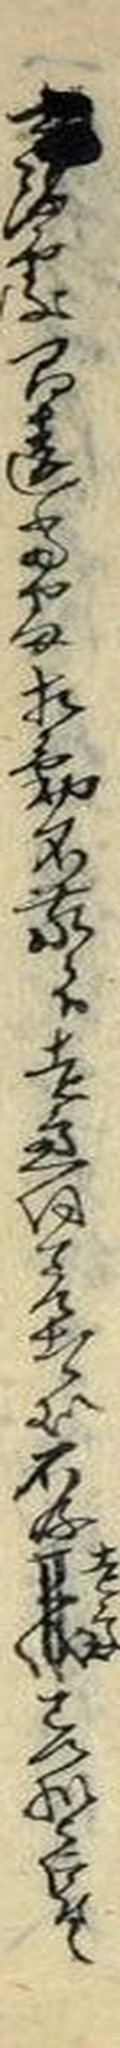可致処間違当番相勤不敬ニ付遠慮伺差出候処不及遠慮差扣被仰付候

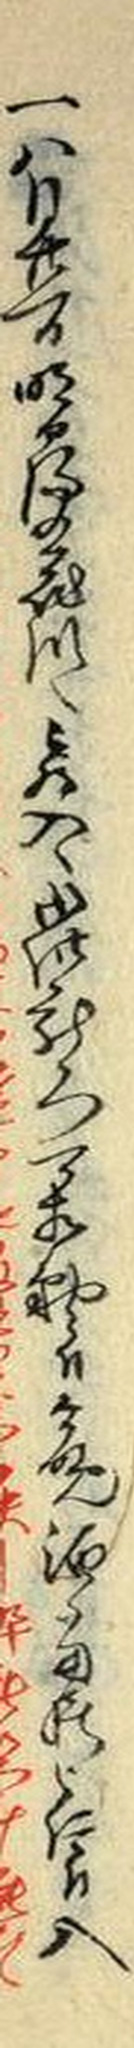一八月廿一日明日湯の花川へ被為入候御供新右衛門可相勤ニ付今晩泊御用捨被仰付八
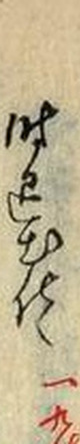時退出仕候
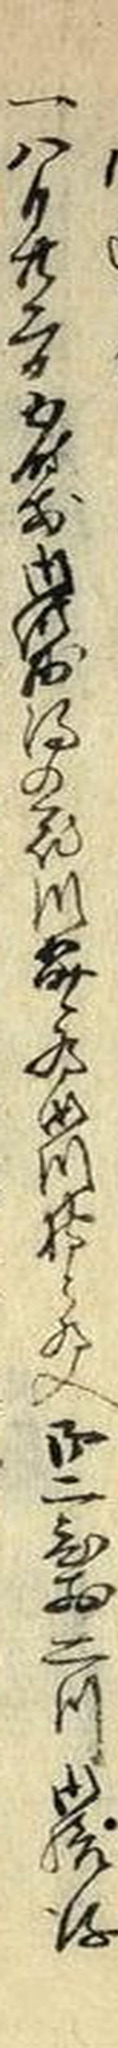一八月廿二日五時前御供揃湯の花川宿へ為御川狩被為入御二度於二川御膳後
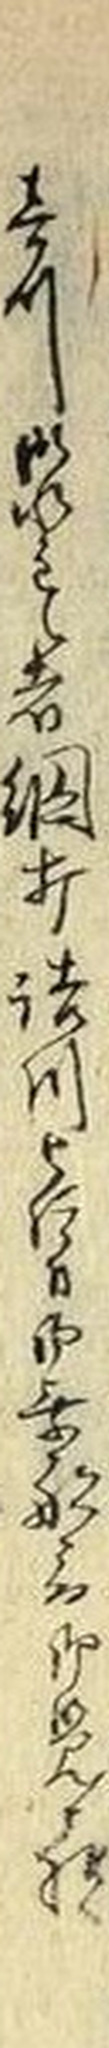壱川御水主之者網打詰川被仰付御乗船ニ而御覧被遊候
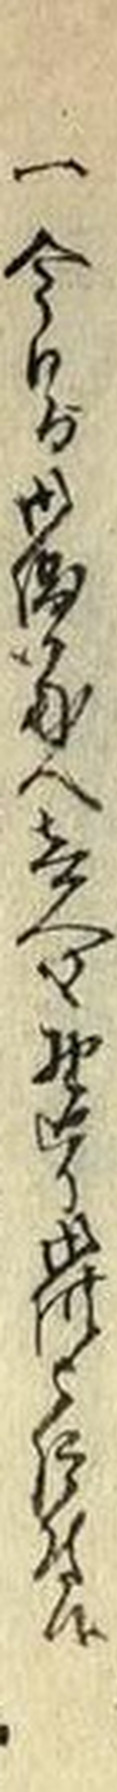一今日ゟ御側御用壱人ツゝ野通り御供被仰付候
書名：少傅日録抄（斉承付側向頭取日記、在国）
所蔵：福井県文書館 Fukui Prefectural Archives
